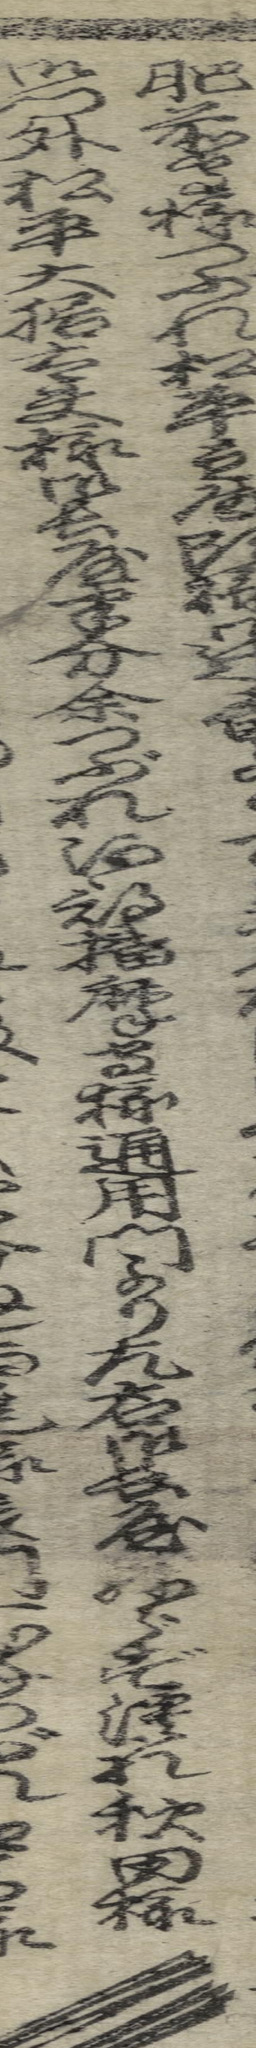御門外松平大膳大夫様御長屋半分余つぶれ阿部播磨守様通用門より左右御長屋残らず潰れ秋田様
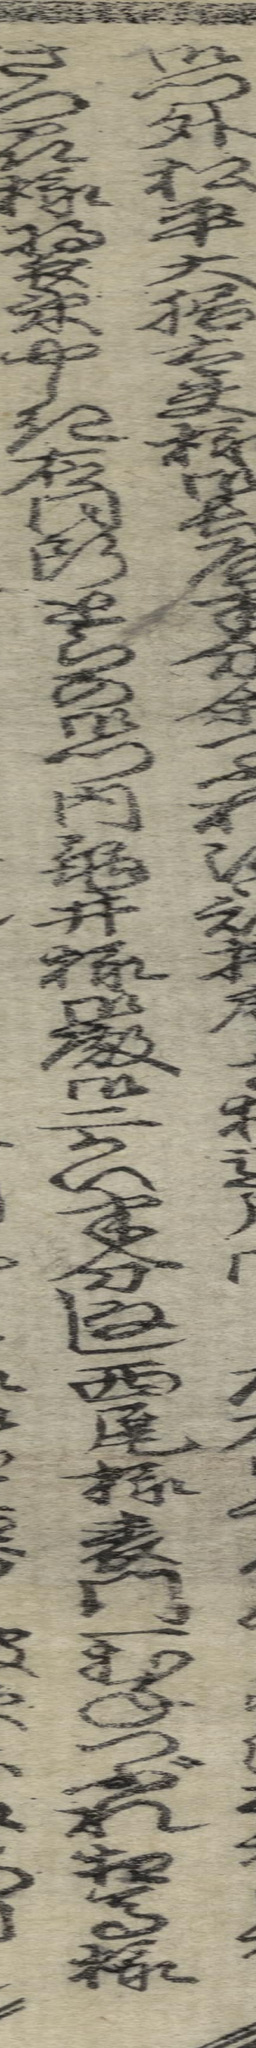さつ州様装束やしき右同断とらの御門内亀井様御殿御ニかい半分なし西尾様表門一むねつぶれ相馬様
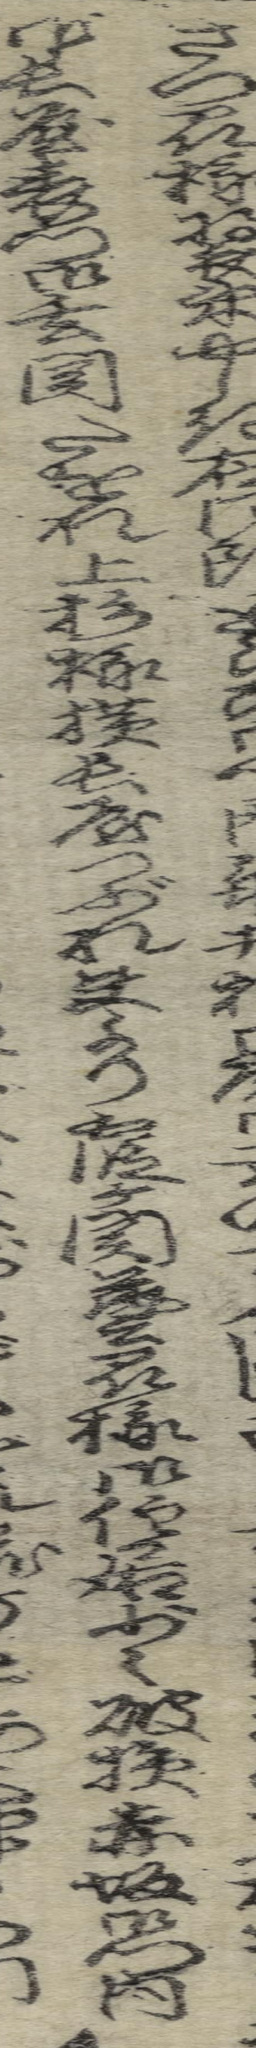御長屋表門御玄関たをれ上杉様横長屋つぶれ夫より霞ヶ関芸州様御住居少〻破損赤坂御門内
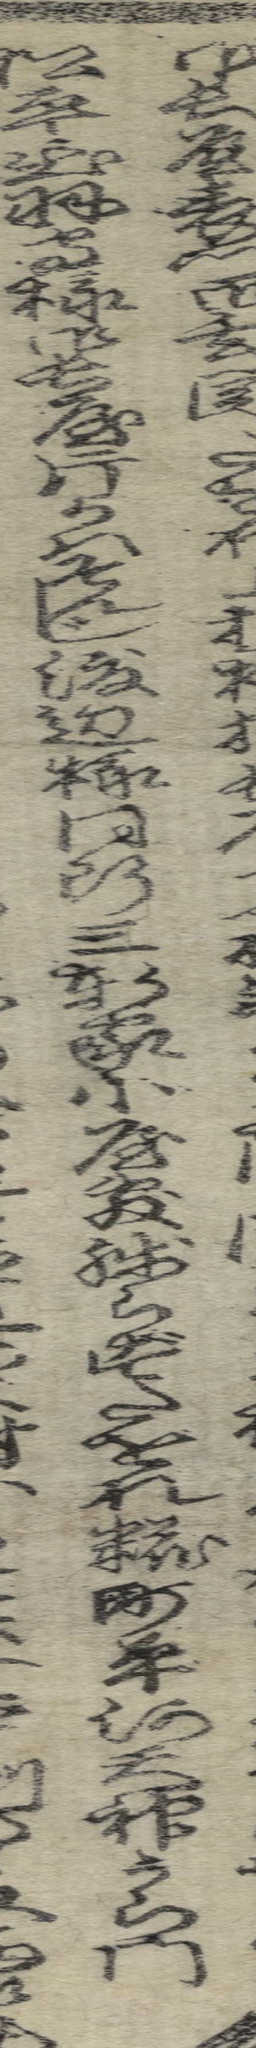松平出羽守様御長屋片かはそんじ渡辺様同断三軒家小屋敷残らずたをれ糀町平河天神うら門
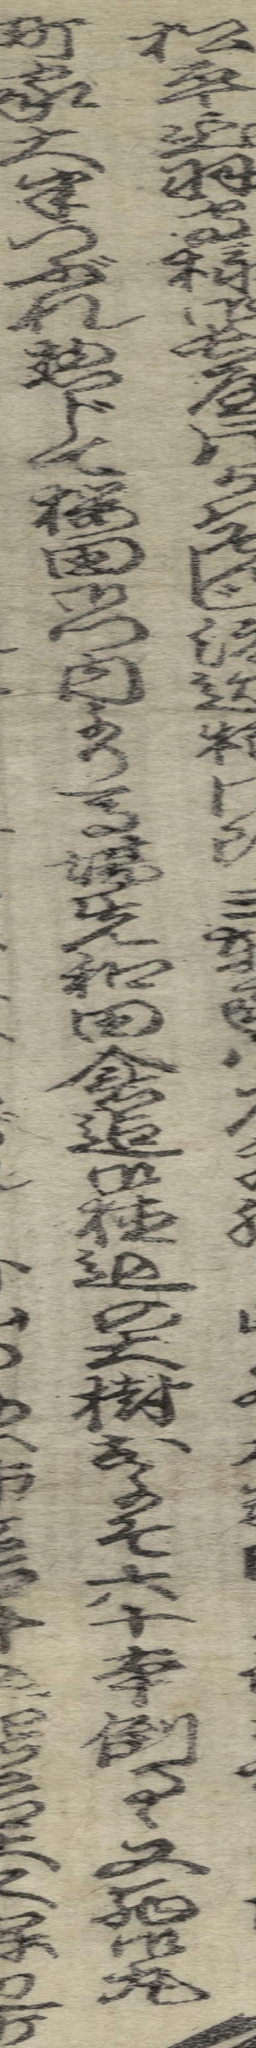町家大半つぶれ惣じて桜田御門内より馬場先和田倉迄御植込の大樹およそ六十本倒るゝ又西御丸
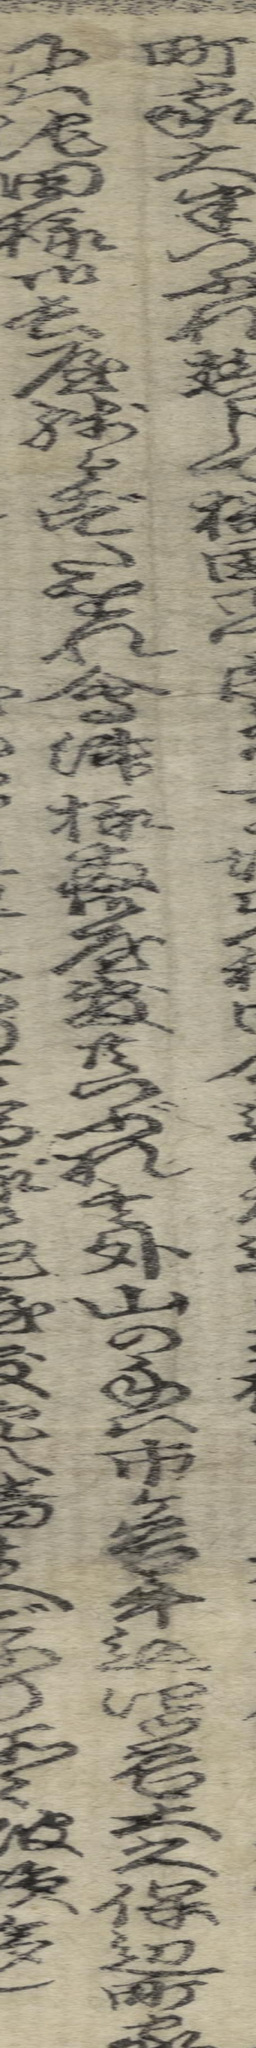下は池田様御長屋残らずたをれ会津様両御屋敷共つぶれ其外山の手は市ヶ谷牛込四ツ谷大久保辺町家
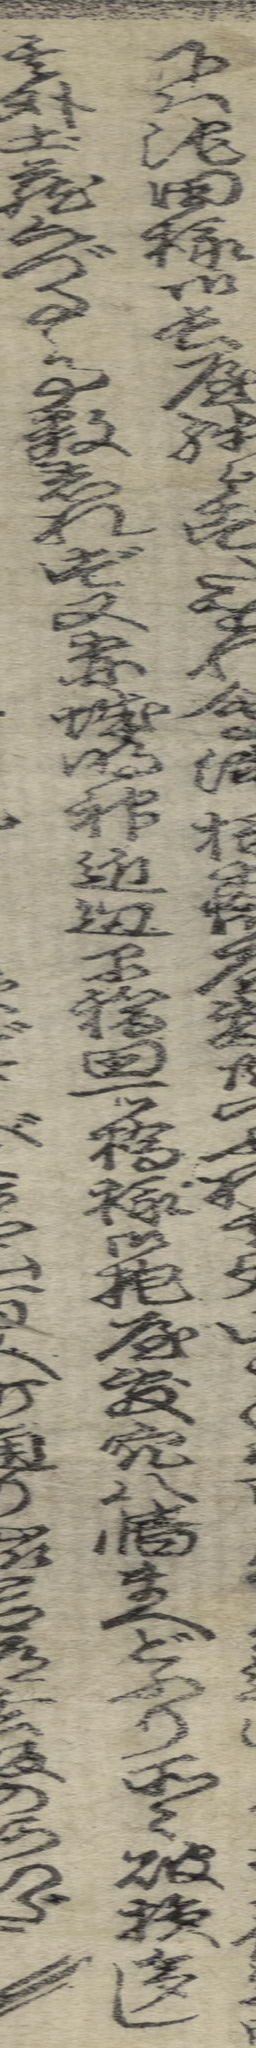其外土蔵くづるゝ事数しれず又赤城明神近辺早稲田一ツ橋様御抱屋敷穴八幡まへどふり所〻破損多し
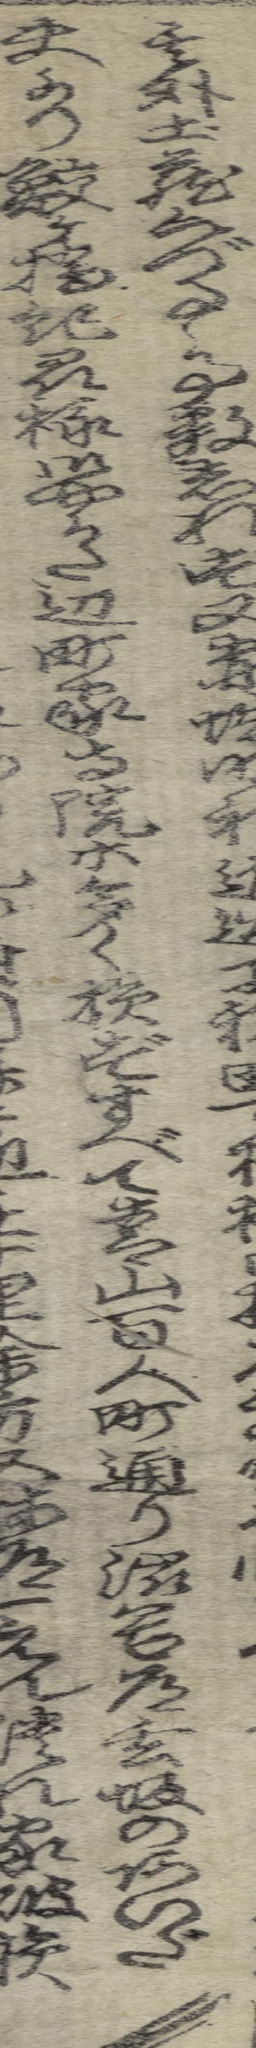夫より鮫ケ橋紀州様御やかた辺町家寺院等多く損ずすべて青山百人町通り渋谷道玄坂のあいだ
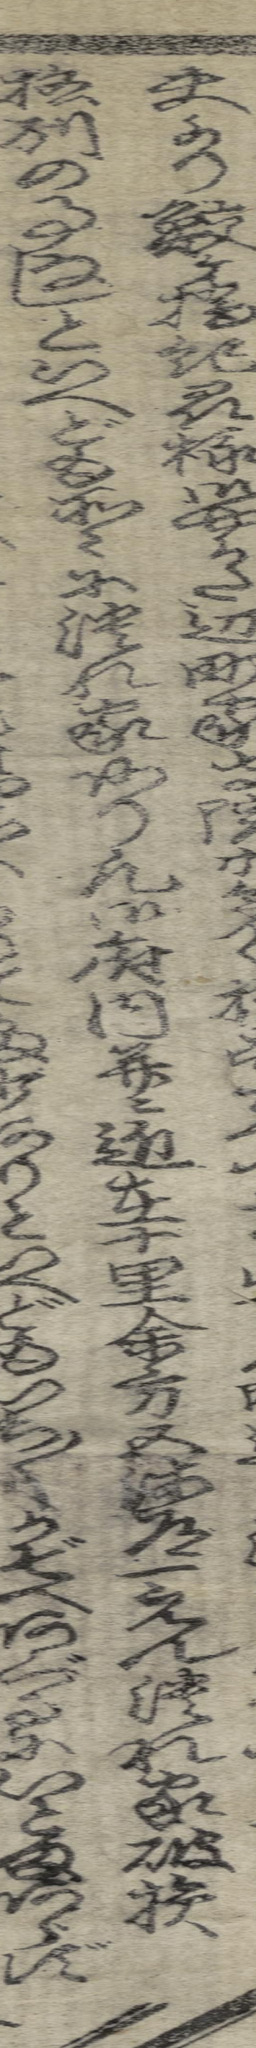格別の事なしといへども所〻に潰れ家あり凡御府内幷ニ近在十里余方五海道一えん潰れ家破損
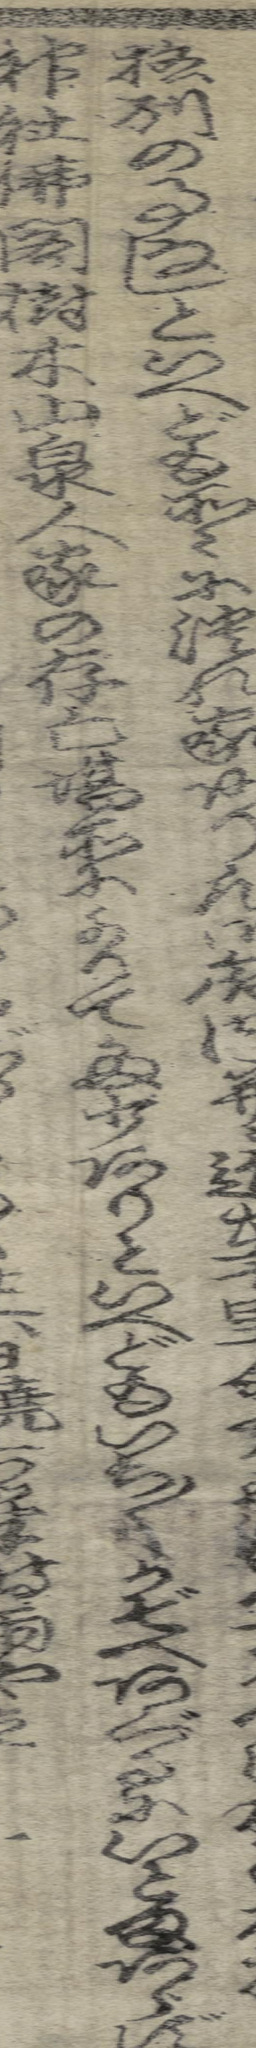神社仏閣樹木山泉人家の存亡場所によりて多少ありといへどもいち〳〵かぞへあぐるにいとまあらず
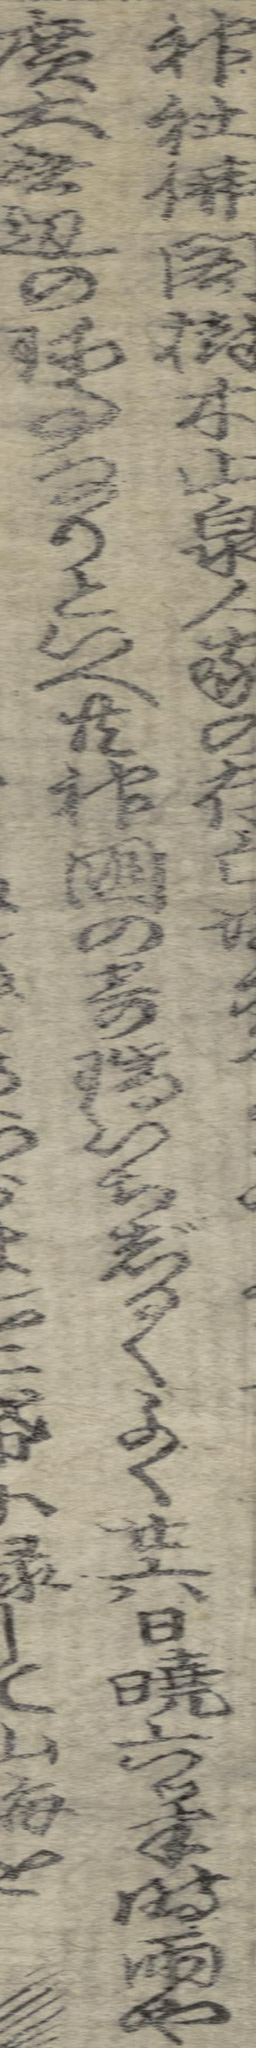広大無辺の珍事なりといへ共神国の寿端いちじるくよく廿六日暁六ツ半時雨やみ
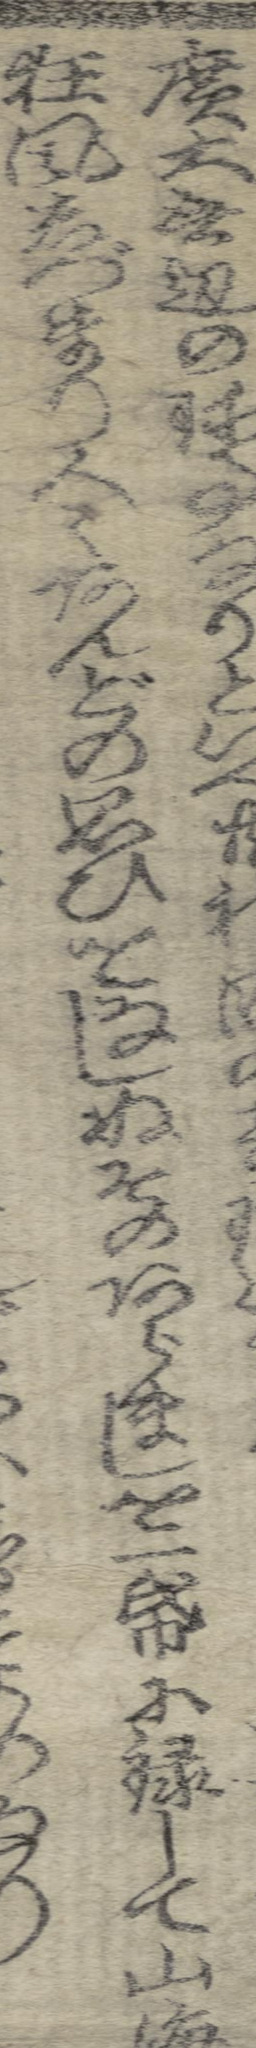狂風しづまり人〻あんどの思ひをなしぬそのあらましを一帋に録して山海を
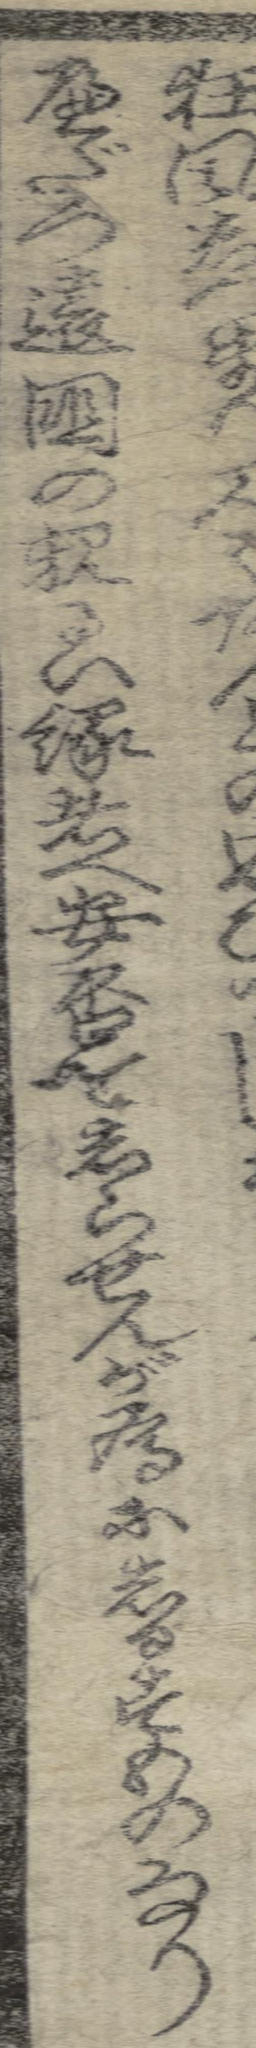へだつ遠国の親るい縁者へ安否をしらせんが為にしるすものなり
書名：江戸十里四方大風出水焼失　場所附
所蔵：東京大学地震研究所図書室 Earthquake Research Institute Library, The University of Tokyo, JAPAN
